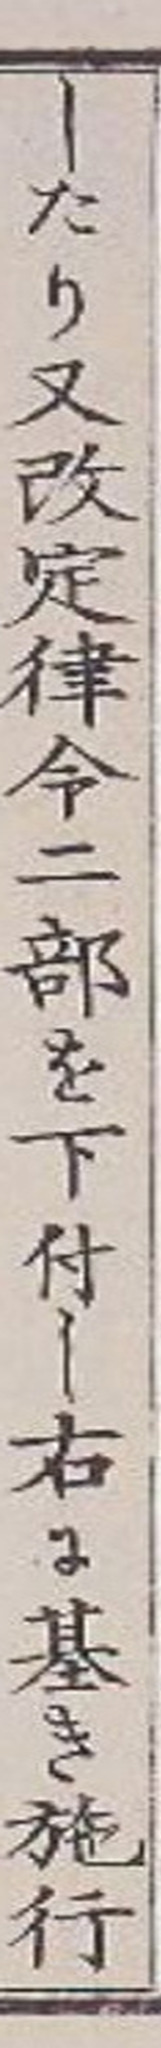したり又改定律令二部を下付し右に基き施行
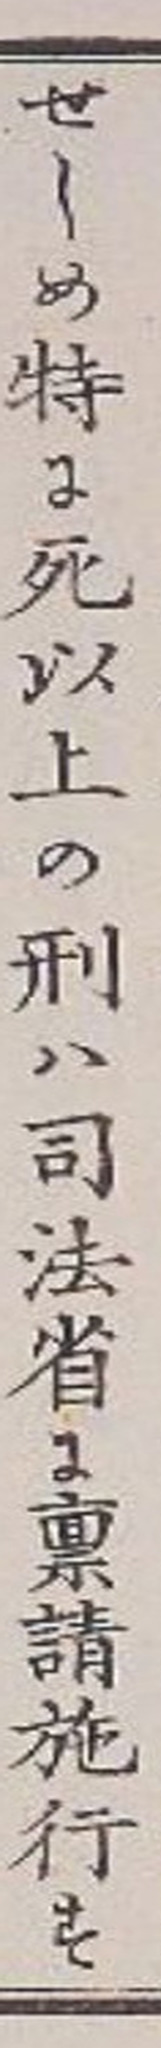せしめ特に死以上の刑は司法省に稟請施行す
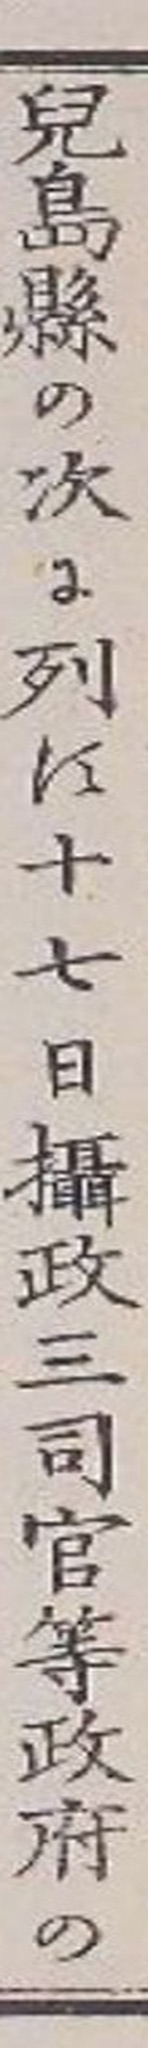児島県の次に列す十七日摂政三司官等政府の
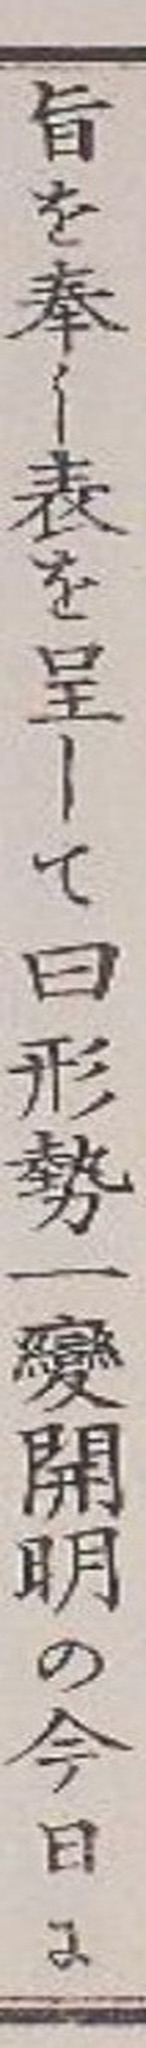旨を奉し表を呈して曰形勢一変開明の今日に
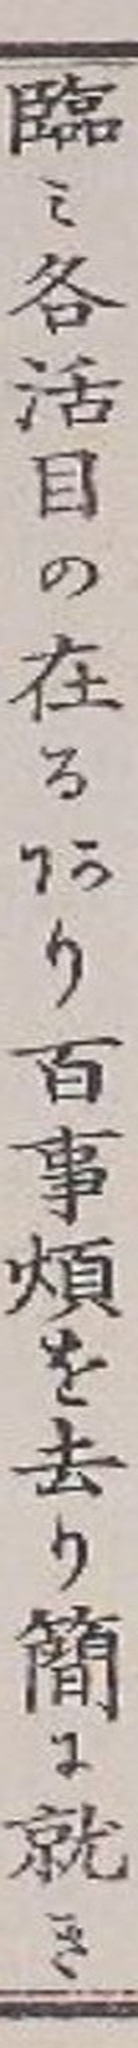臨み各刮目の在るなり百事煩を去り簡に就き
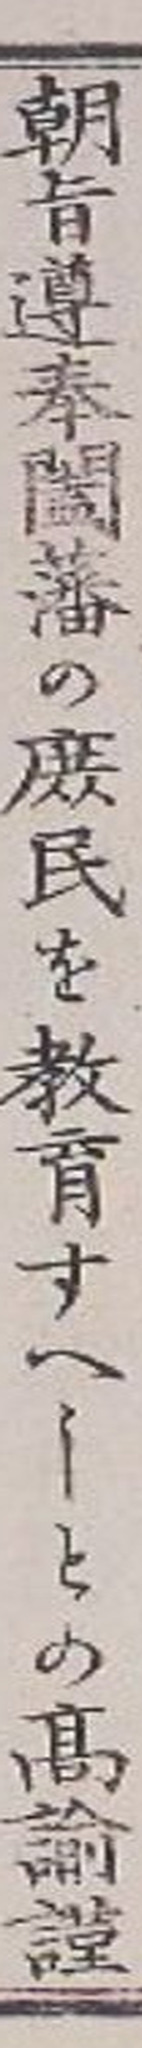朝旨導奉闔藩の庶民を教育すへしとの高諭謹
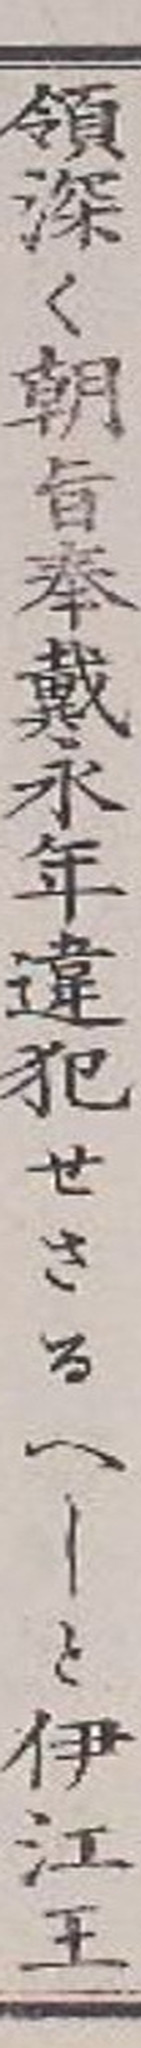領深く朝旨奉戴永年違反せさるへしと伊江王
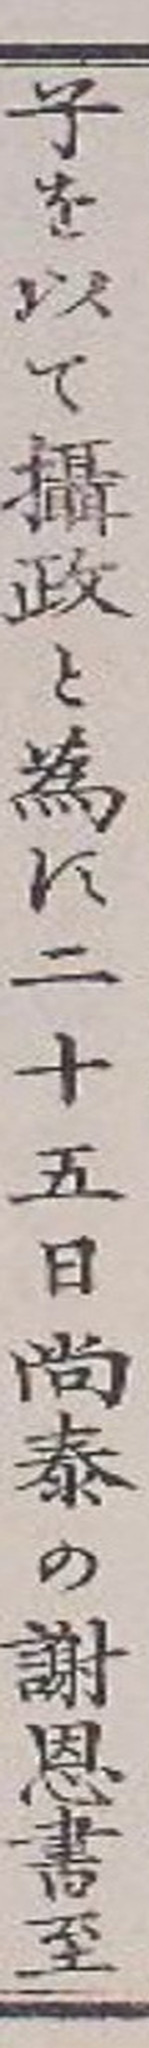子を以て摂政と為す二十五日尚泰の謝恩書至
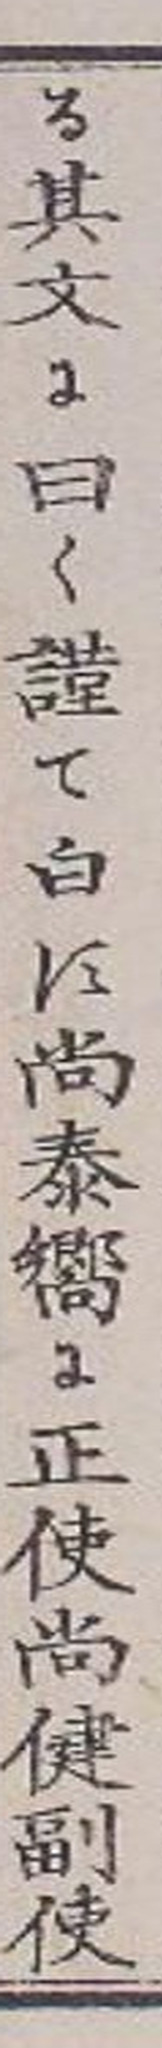る其文に曰く謹て白す尚泰向に正使尚健副使

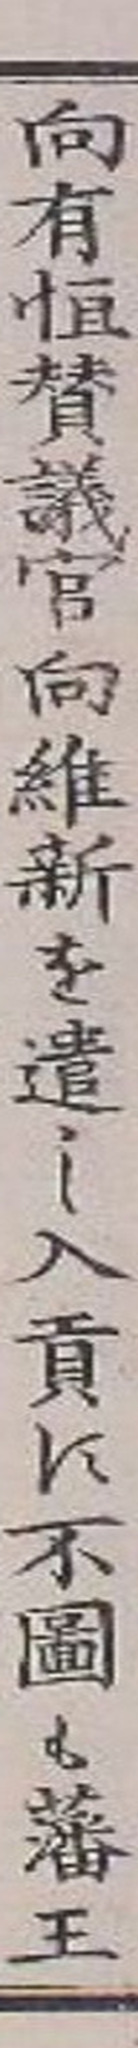向有恒賛議官向維新を遣し入貢す不図も藩王
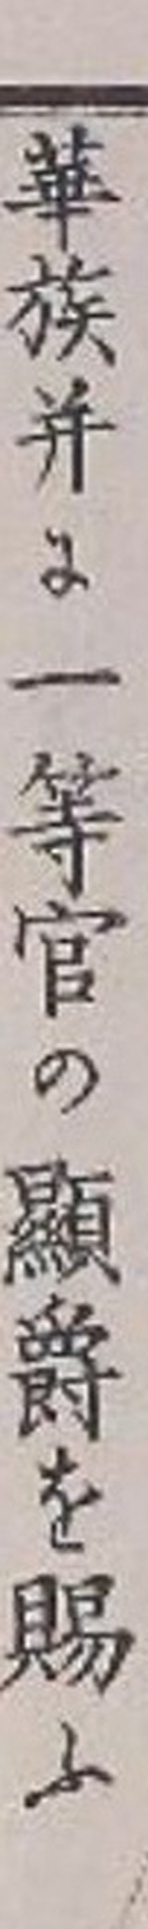華族並に一等官の顕爵を賜ふ
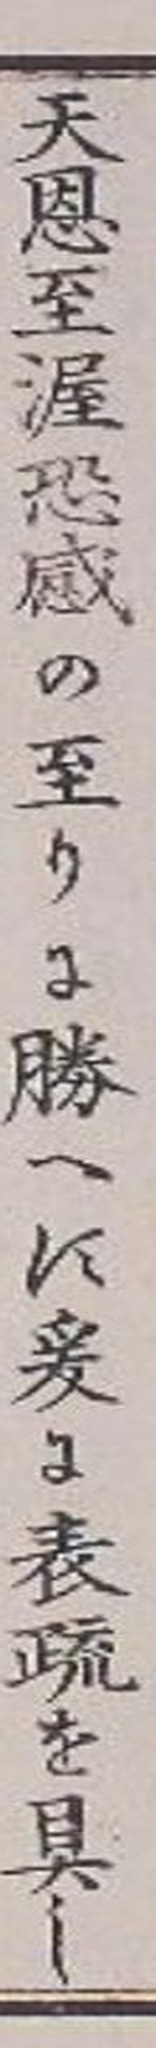天恩至渥恐感の至りに勝へす爰に表疏を具し
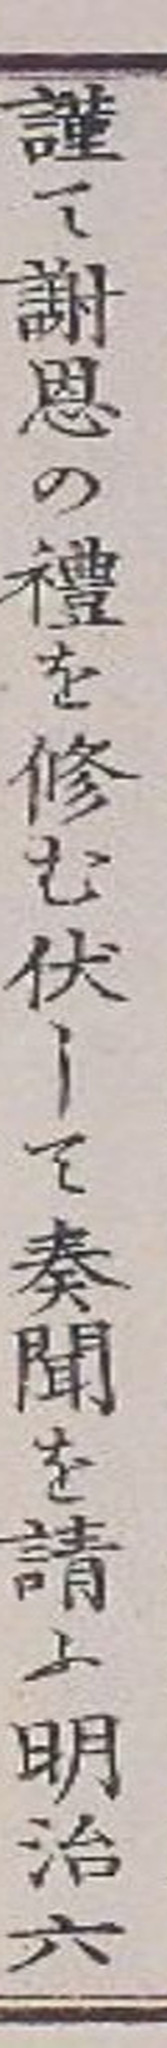謹て謝恩の礼を修む伏して奏聞を請ふ明治六
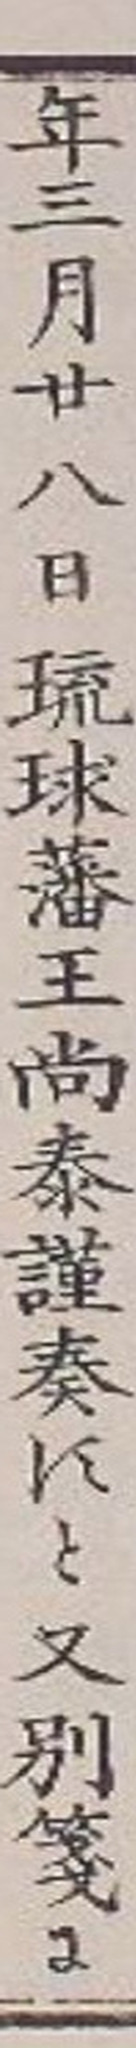年三月廿八日琉球藩王尚泰謹奏すと又別箋に
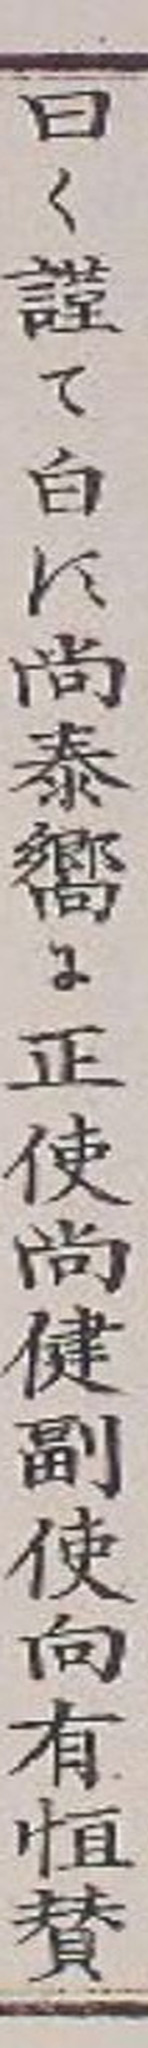曰く謹て白す尚泰向に正使尚健副使向有恒賛
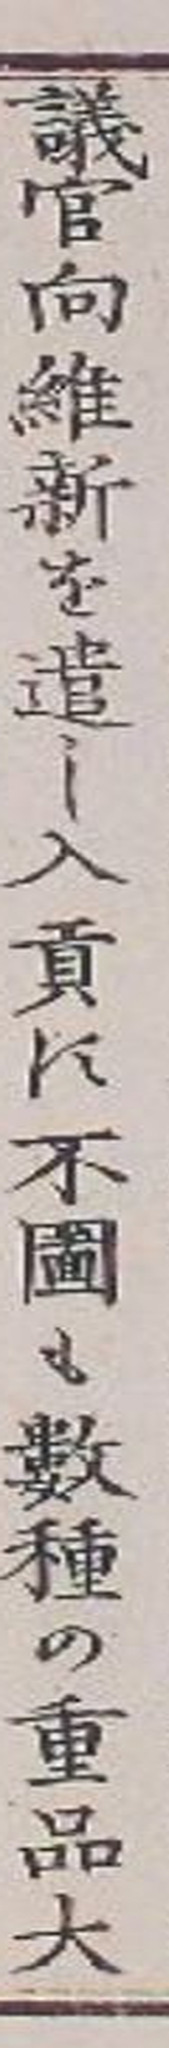議官向維新を遣し入貢す不図も数種の重品大
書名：南島紀事 下
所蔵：University of the Ryukyus Library
